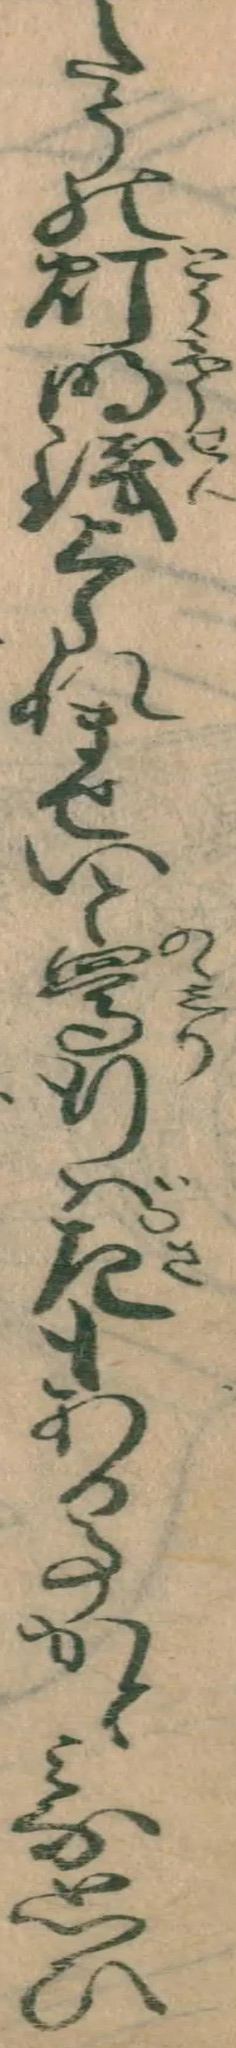たうの灯明銭上られませいと罵行ば。左もある事かとみな思ひ
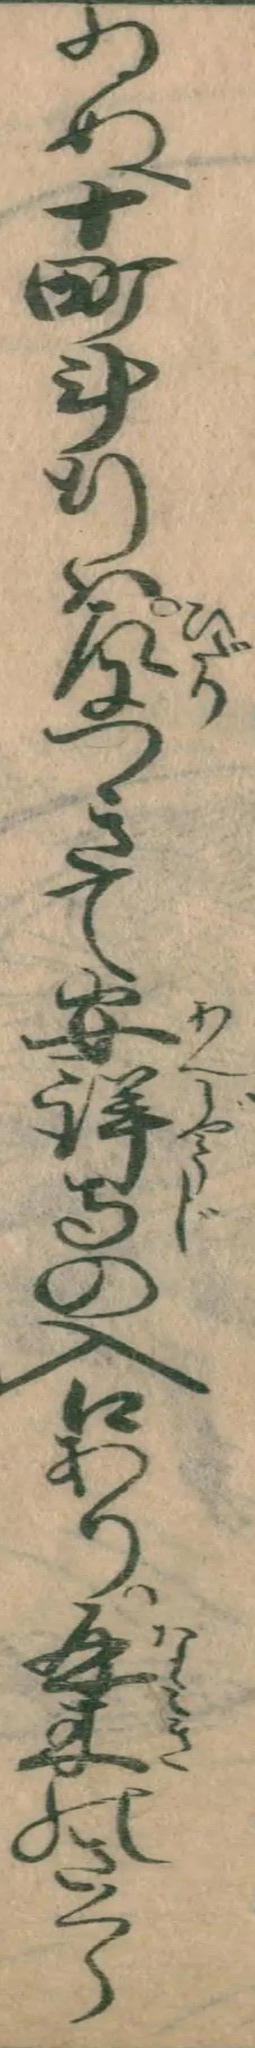ゐぬ十町計行は。左につきて安祥寺の入口あり。並木のさくら
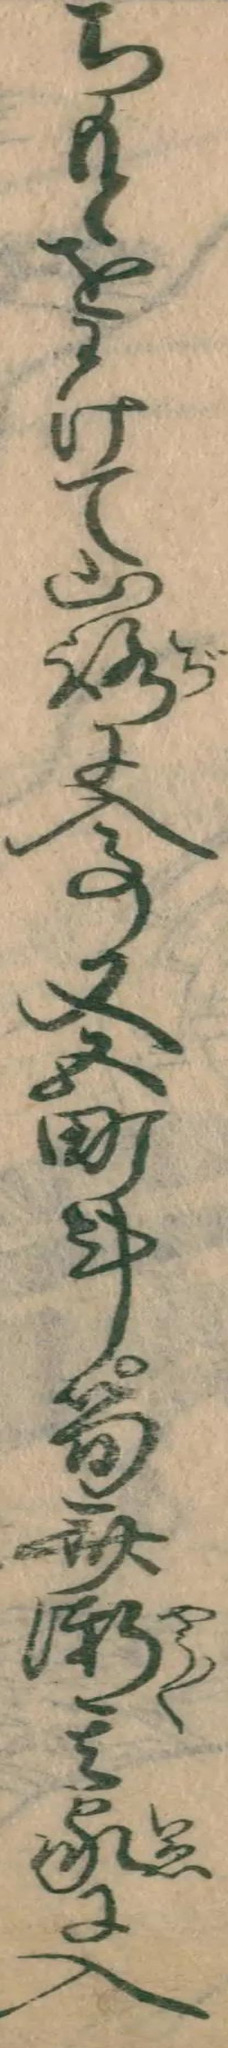ちもとをわけて山路に入事又五町計。筍斎漸其家に入
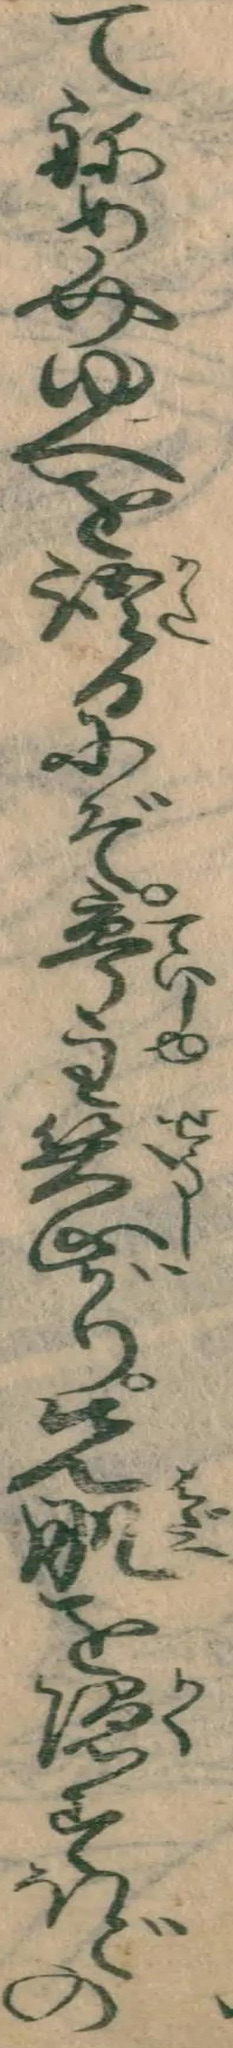てねめ介ゆへを語るにぞ。亭主笑止がり。先肌を隠すほどの
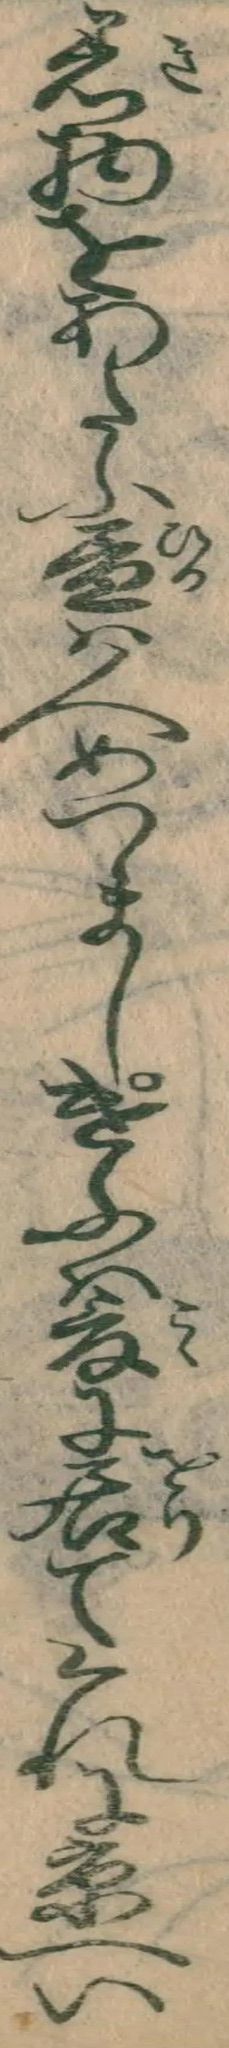着物をあたふ昼は人めつゝまし。けふは爰に居てくれに京へい
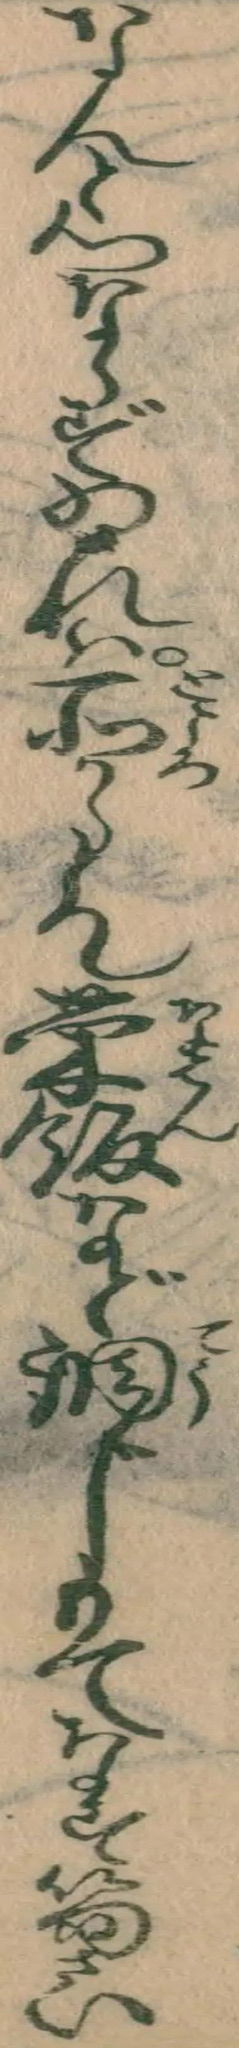なんと心ならずゐれは。所からして菜飯など調じもてなす筍さい
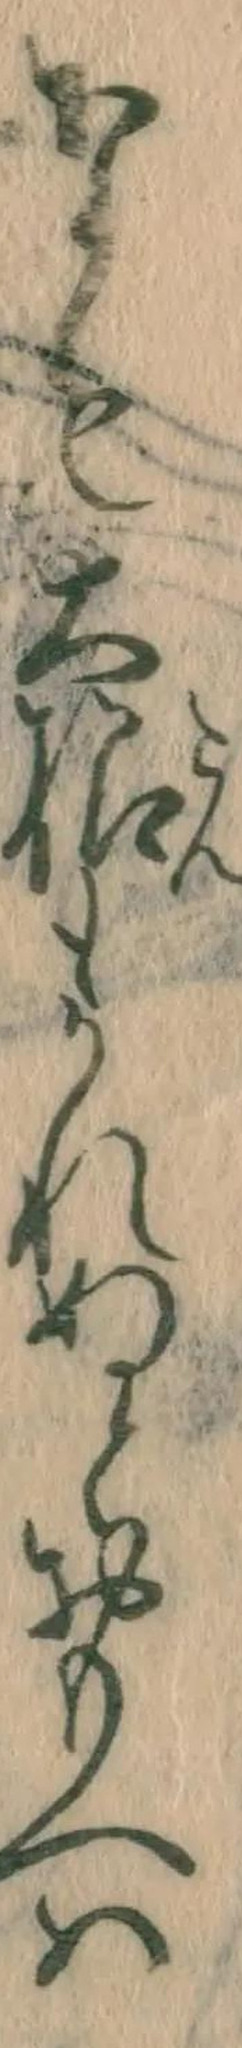なも大根もかれぬとおもへは
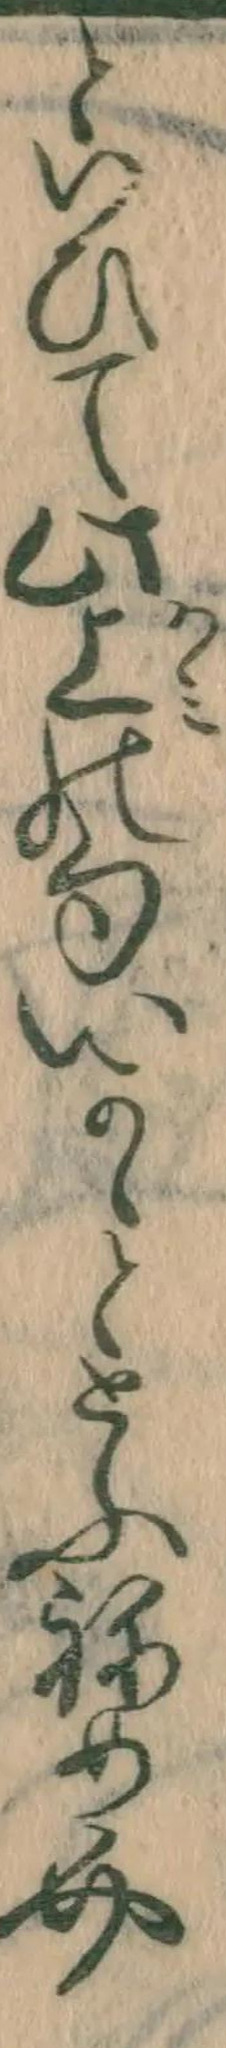といひて此上の句いかゝととふねめ介
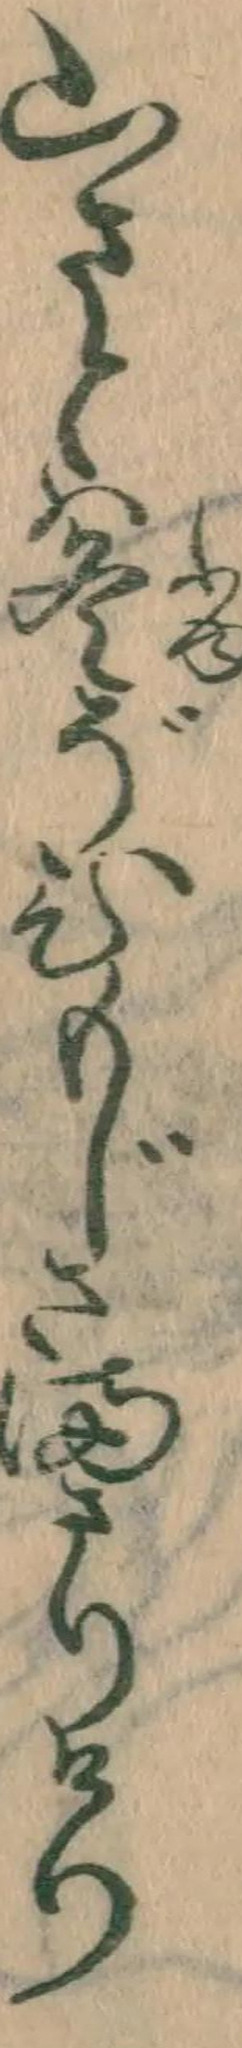山さとは冬ぞひもじさまさりけり
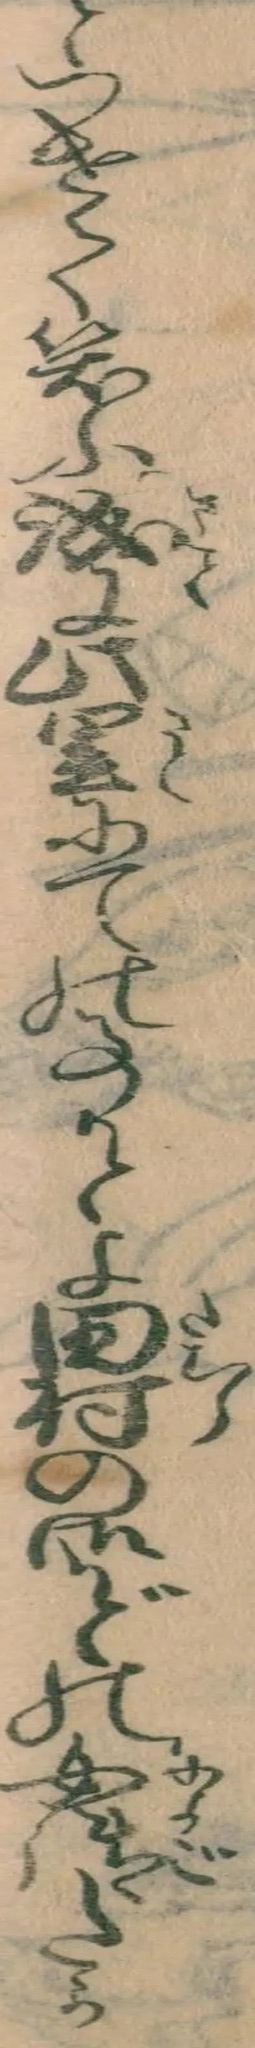とつけて笑ふ。誠に此里にての事かとよ田村の御かどの女御たか
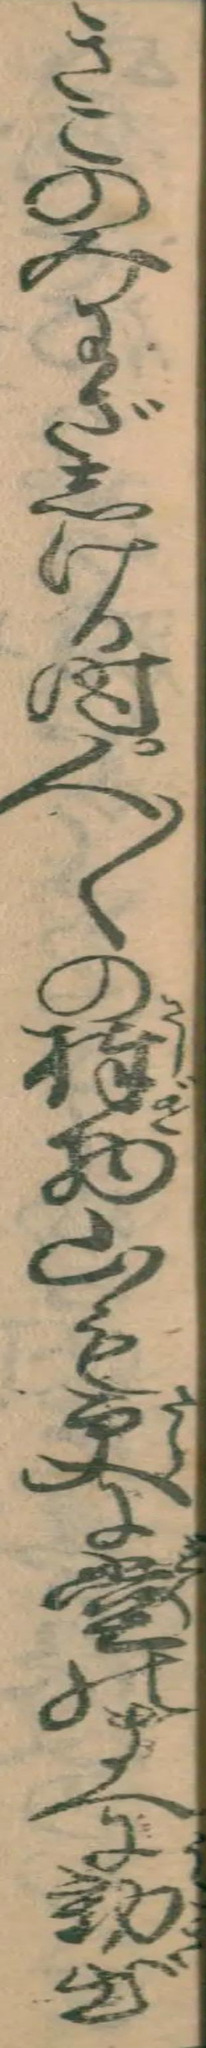きこのみわざしける時。人々の捧物山も更に堂のまへに動出
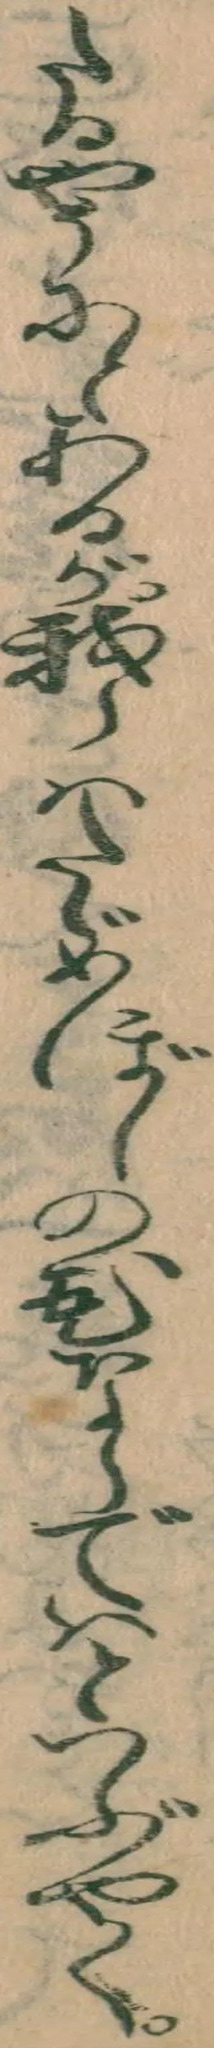たるやうにとあるが。我らはたゞめぼしの花ならではとつぶやく。
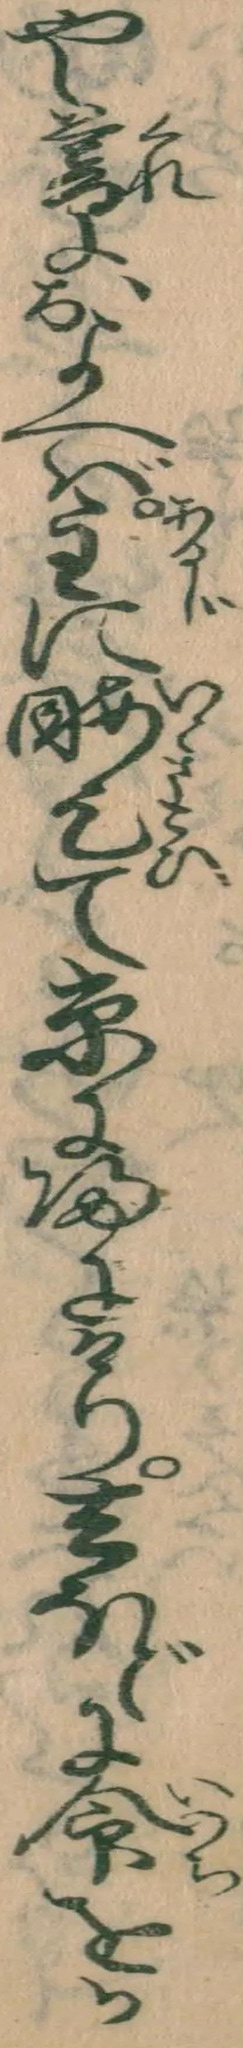やゝ暮におよへば。主に暇乞て京に帰にけり。去ほどに命をか
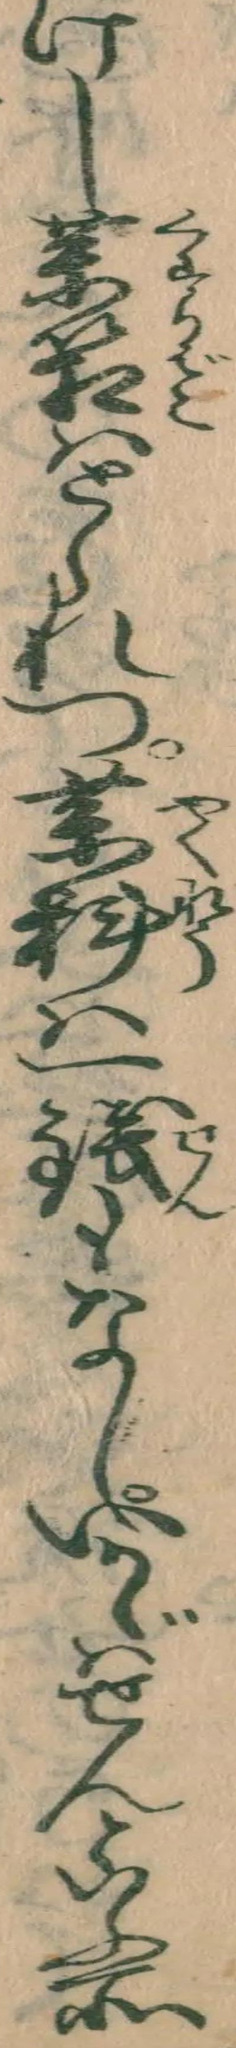けし薬箱はとられつ。薬料は一銭もなし。いかゞはせんといふ所
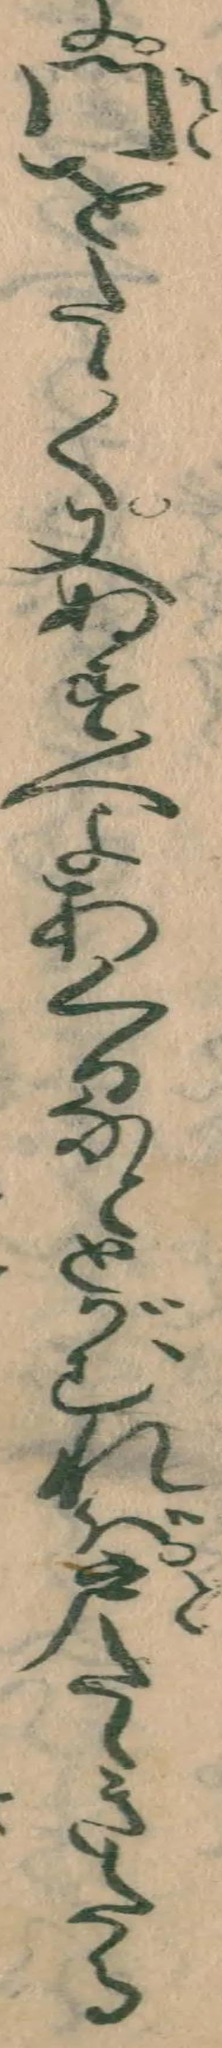に。門をたゝ〱。又ぬす人よあくるなととがむれば。戸たゝきたる
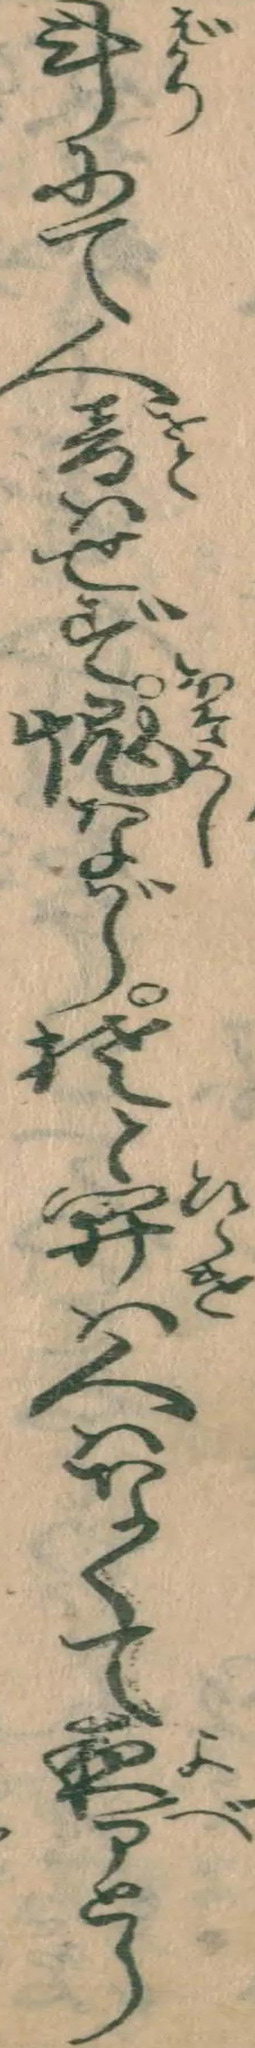計にて人音はせず。恐ながら。そと開は人はなくて夜部とら
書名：新竹斎 5巻
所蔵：国立国会図書館 National Diet Library, JAPAN
